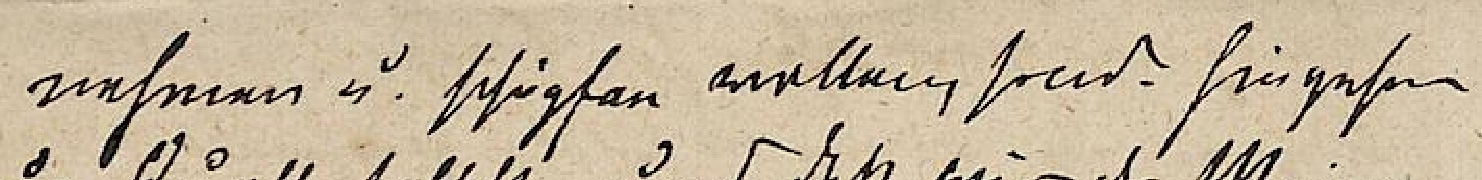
nehmen u. schöpfen wollen, sond. hingehen
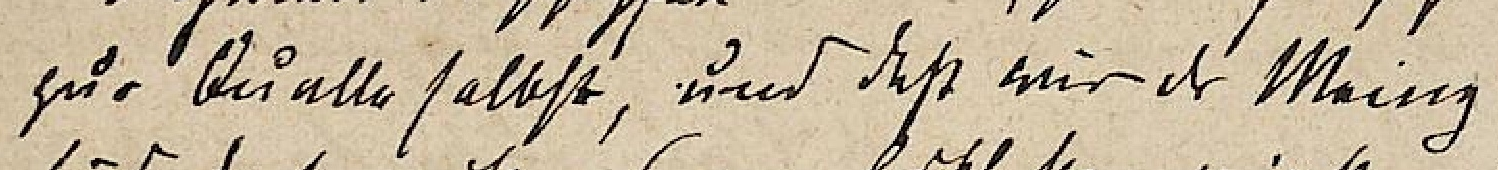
zur Quelle selbst, und daß wir dr Meing
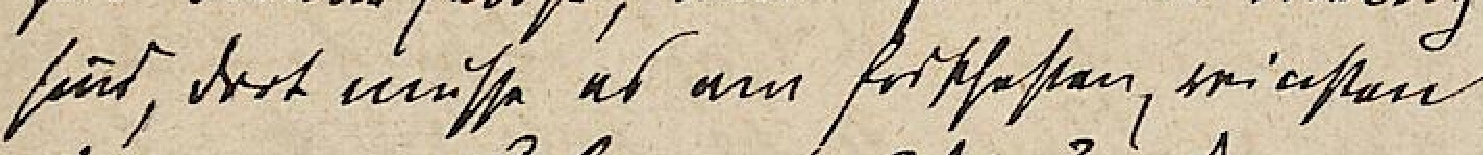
sind, dort müsse es am frischesten, reinsten
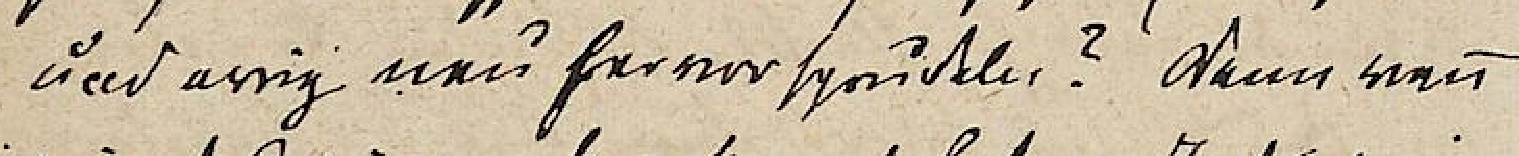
und ewig neu hervorsprudeln? Denn wen
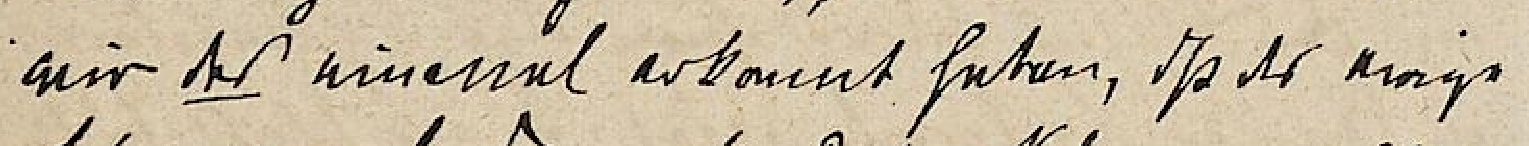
wir das einmal erkannt haben, dß ds ewige
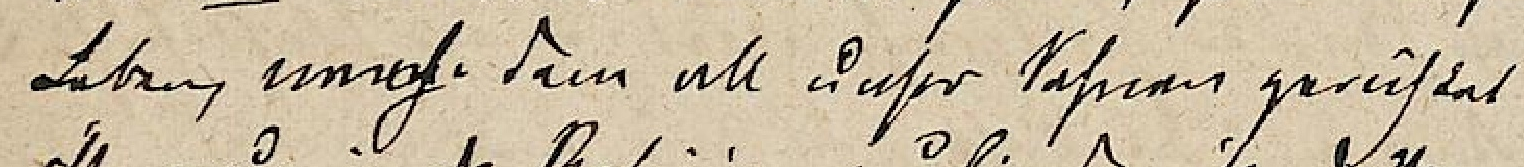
Leben, nach dem all unser Sehnen gerichtet
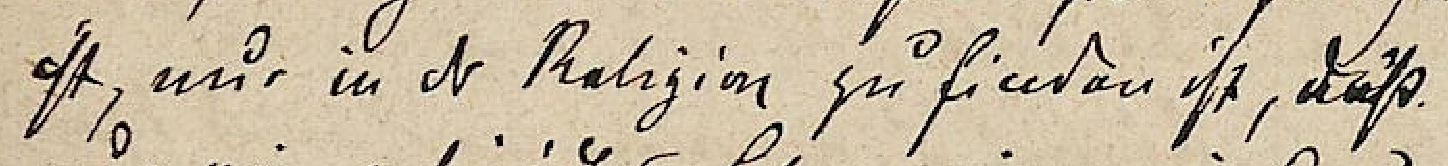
ist, nur in dr Religion zu finden ist, daß
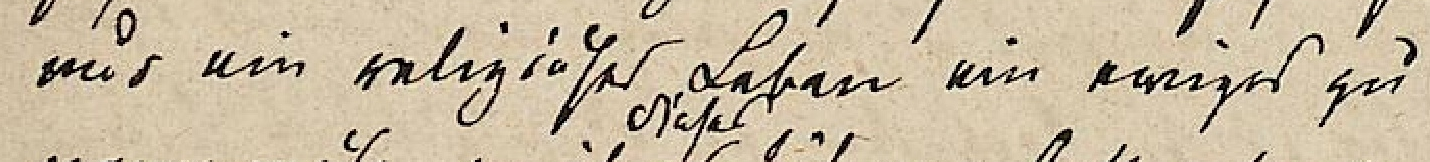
nur ein religiöses Leben, ein ewiges zu
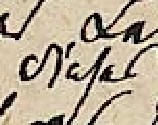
dieses
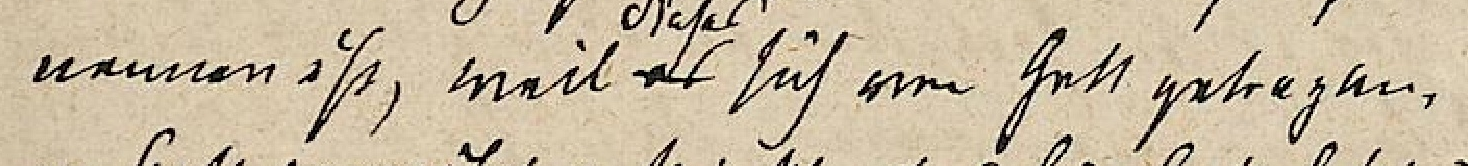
nennen ist, weil es sich von Gott getragen,
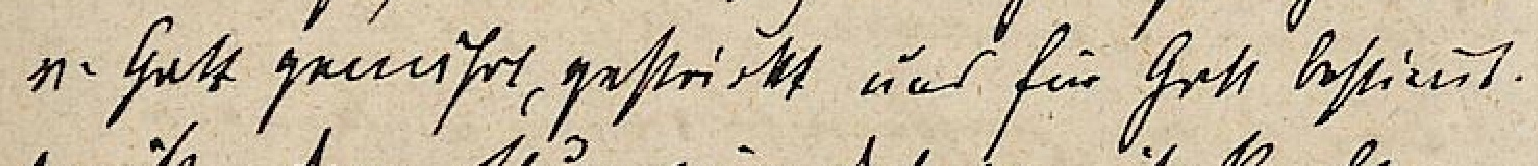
v. Gott genährt, gestärckt und für Gott bestimt
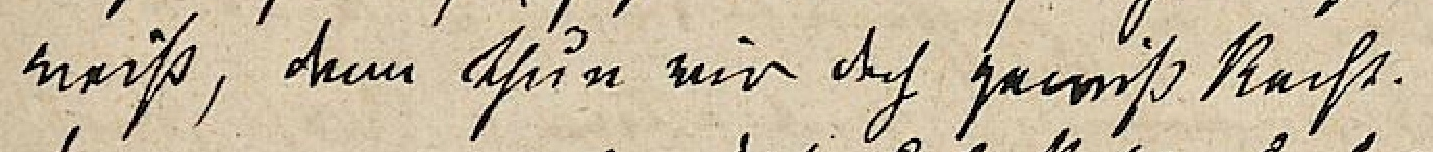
weiß, dann thun wir doch gewiß Recht
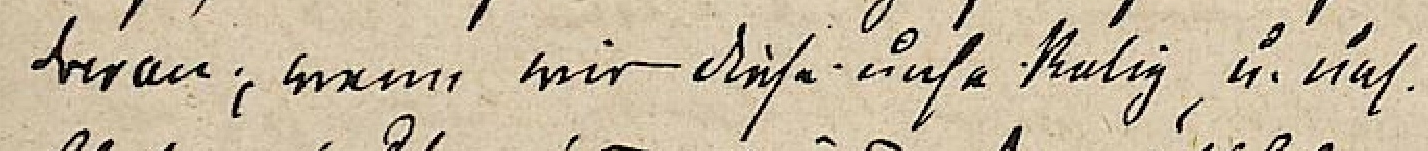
daran; wenn wir dies unsr Relig; u. uns.
